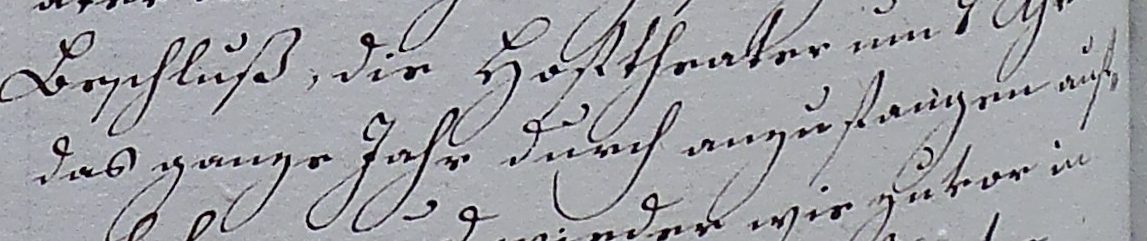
das ganze Jahr durch anzufangen auf¬
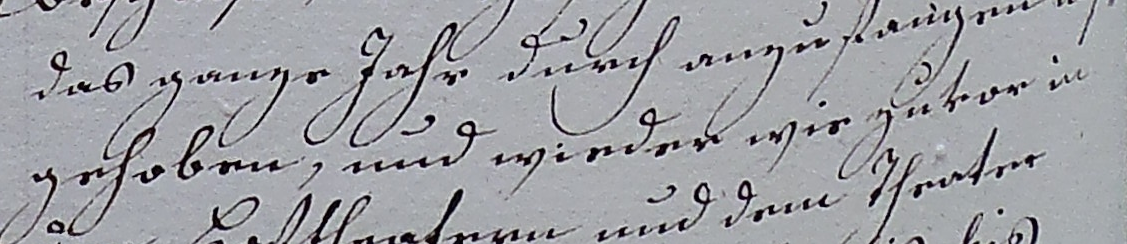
gehoben, und wieder wie zuvor in
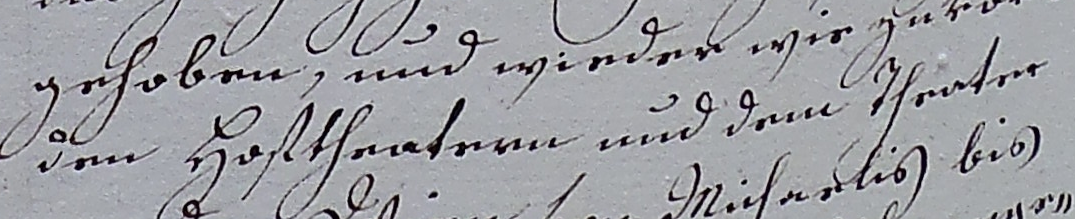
den Hoftheatern und dem Theater
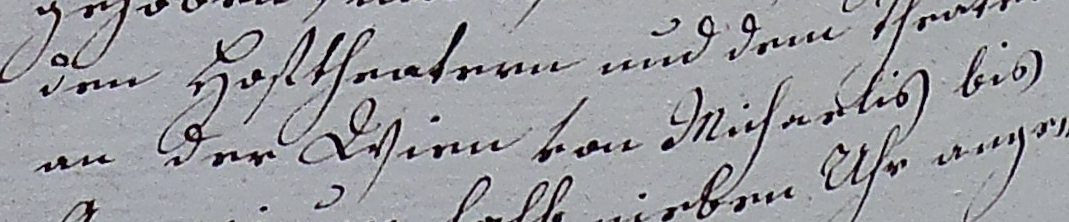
an der Wien von Mihaelis bis
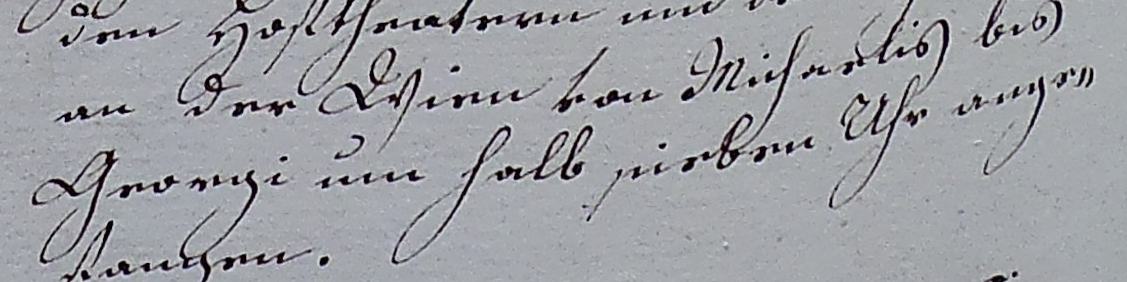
Georgi um halb sieben Uhr ange¬
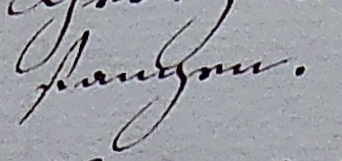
fangen.
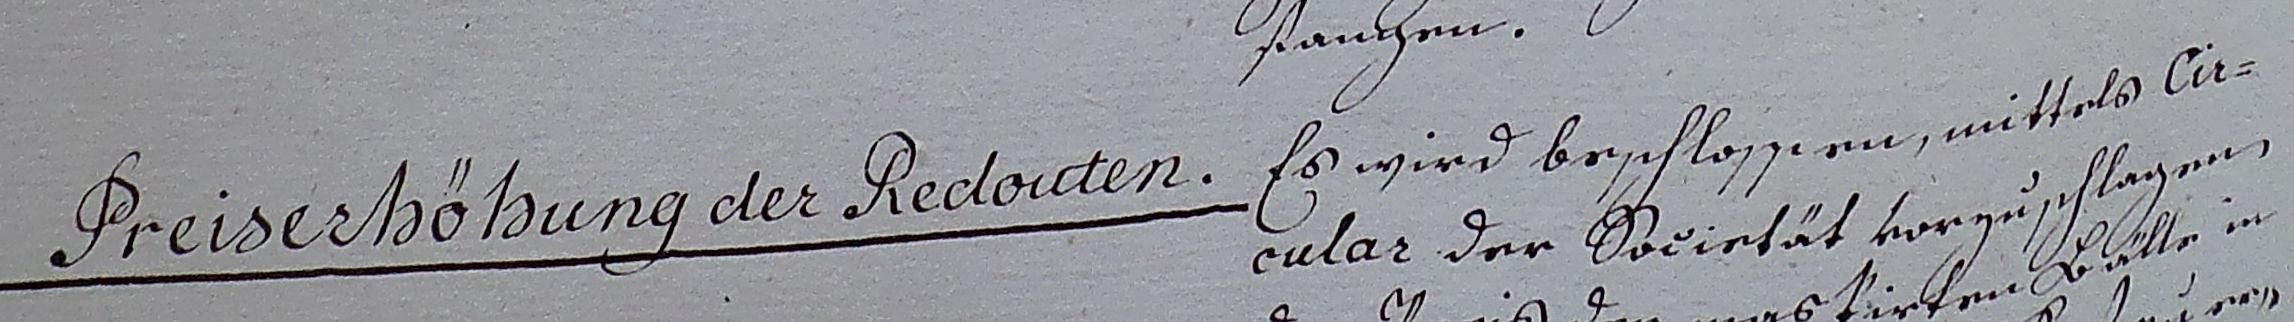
Preiserhöhung der Redouten. Es wird beschlossen, mittels Cir¬
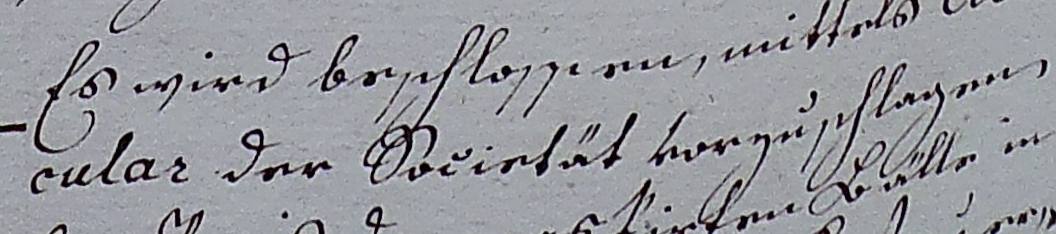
cular der Societät vorzuschlagen,
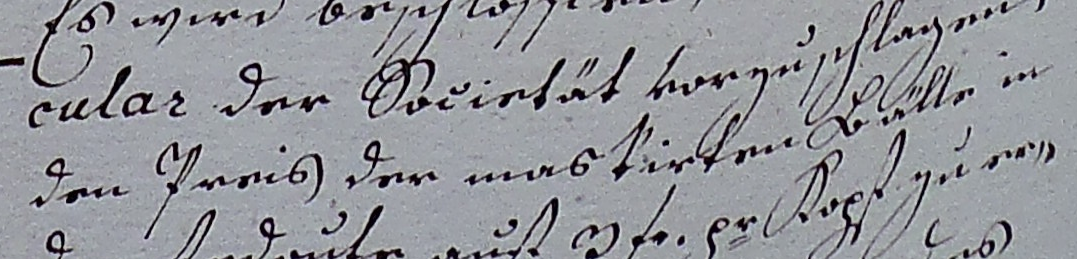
den Preis der maskirten Bälle in
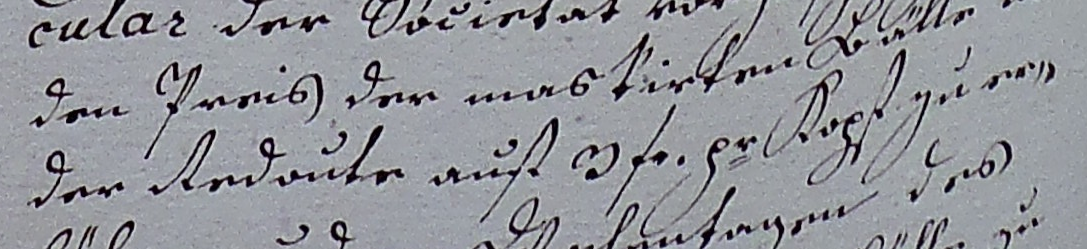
der Redoute auf 3fr. pr͇ Kopf zu er¬
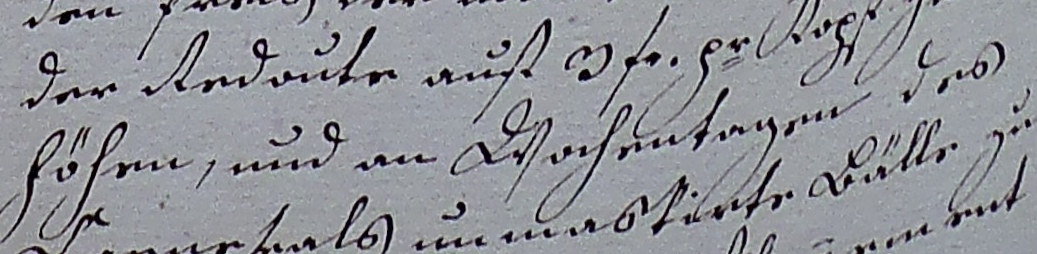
höhen, und an Wochentagen des
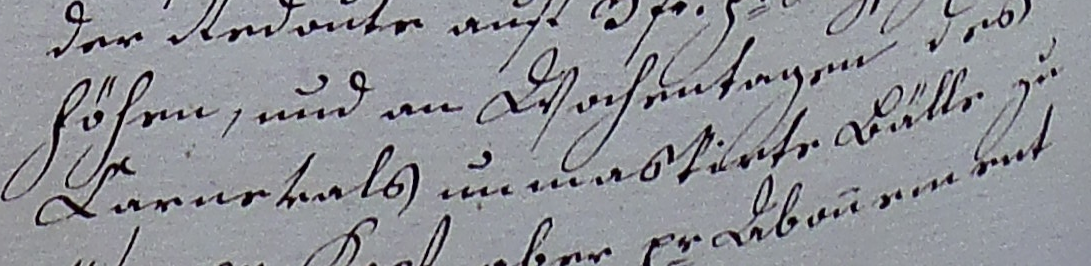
Carnevals ummaskirte Bälle zu
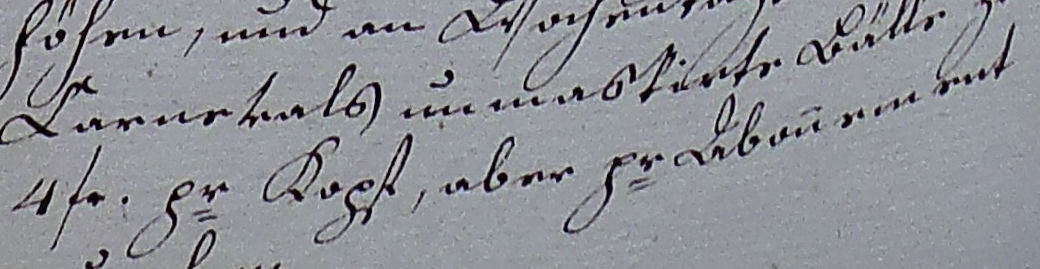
4fr. pr͇ Kopf, aber pr͇ Abon̅ement
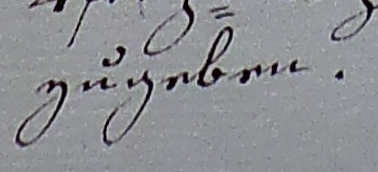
zugeben.
